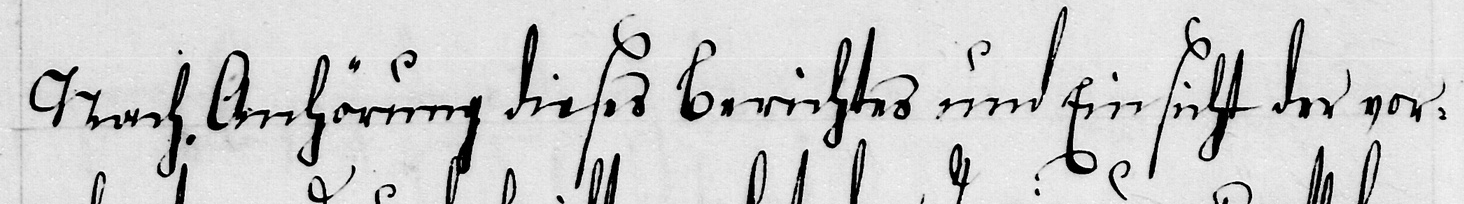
Nach Anhörung dieses Berichtes und Einsicht der vor¬
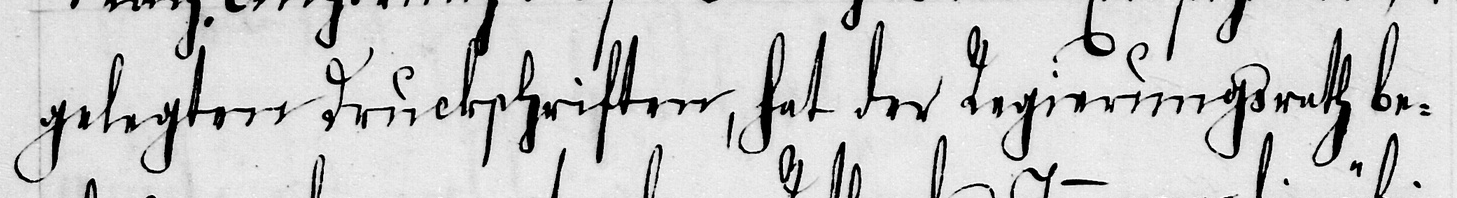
gelegten Druckschriften, hat der Regierungsrath be¬
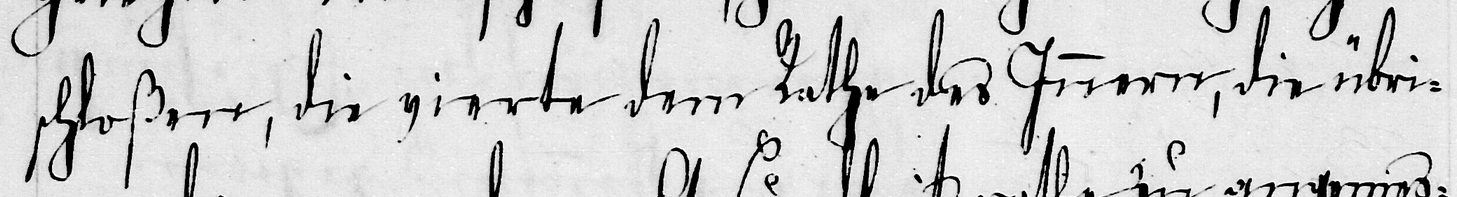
schloßen, die vierte dem Rathe des Innern, die übri¬
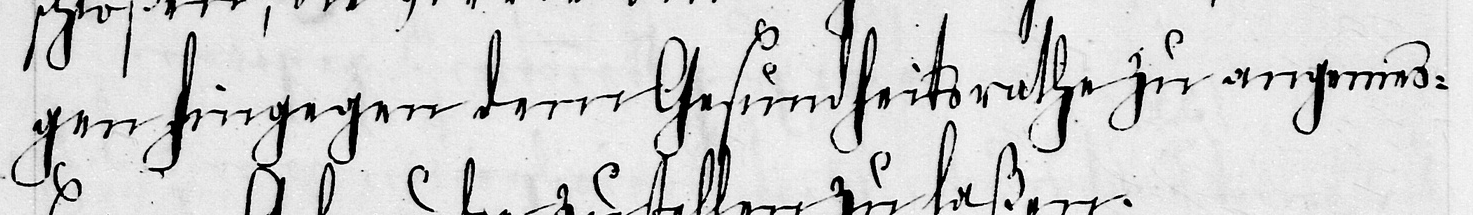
gen hingegen dem Gesundheitsrathe zu angemeß¬
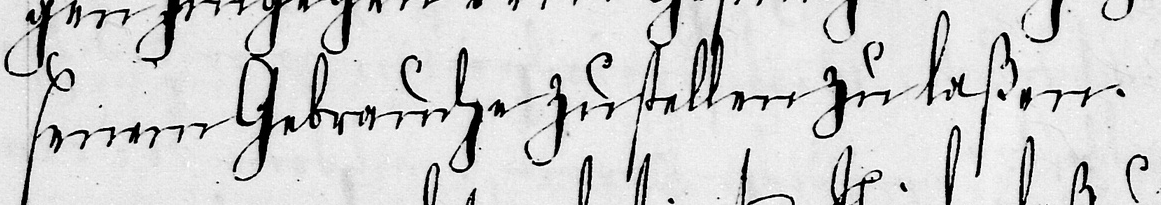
enem Gebrauche zustellen zu laßen.
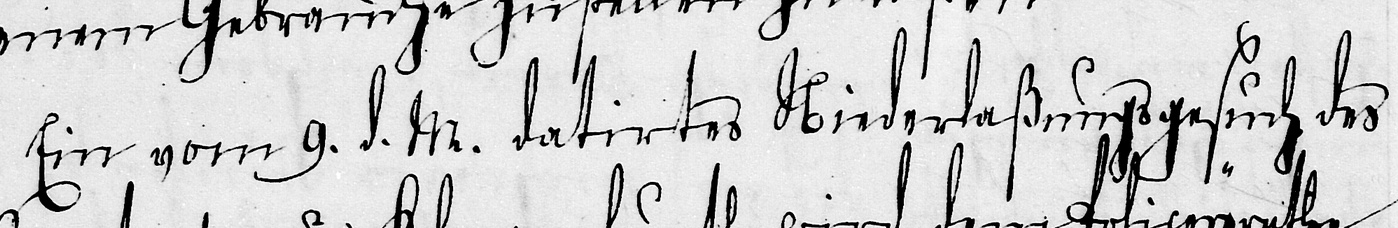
Ein vom 9. d. M. datirtes Niederlaßungsgesuch des
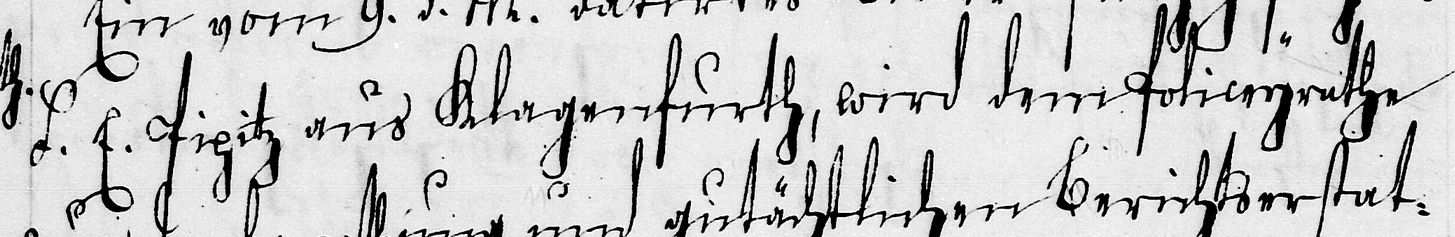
F. E. Pipitz aus Klagenfurth, wird dem Policeyrathe
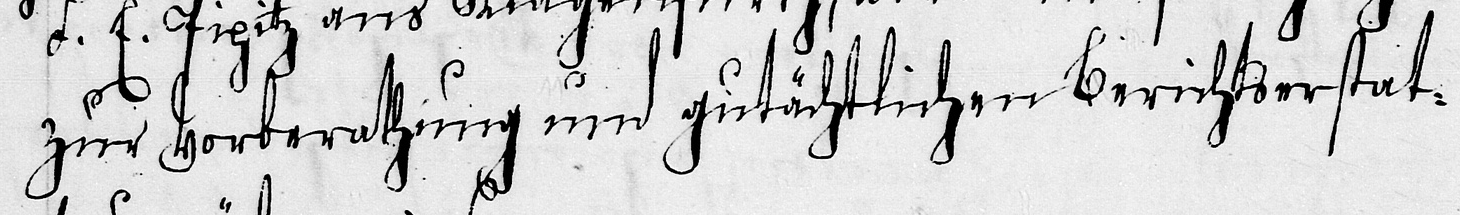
zur Vorberathung und gutächtlichen Berichtserstat¬
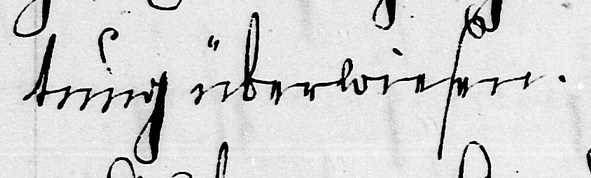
tung überwiesen.
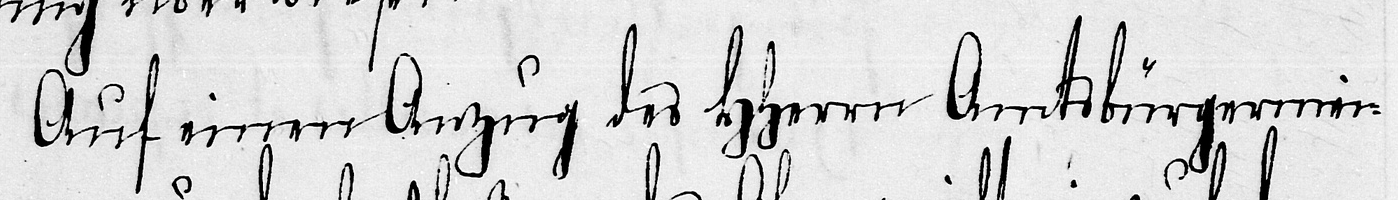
Auf einen Antrag des HHerrn Amtsbürgermeis¬
